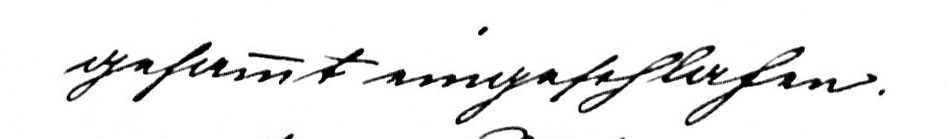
gesammt eingeschlafen.
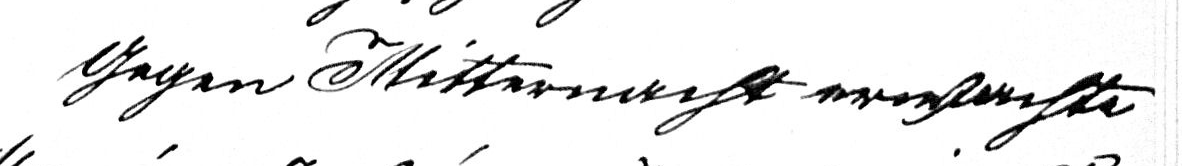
Gegen Mitternacht erwachte
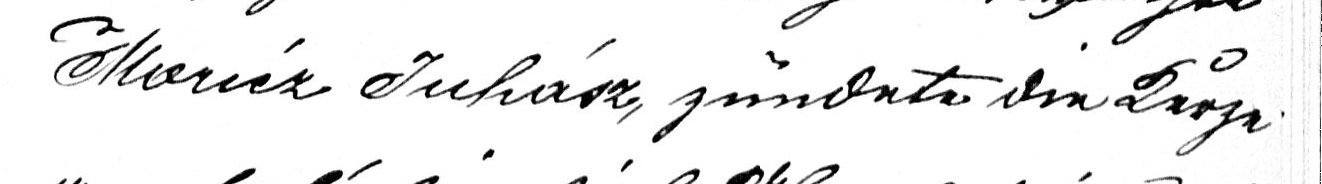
Moriéz Juhász, zündete die Kerze
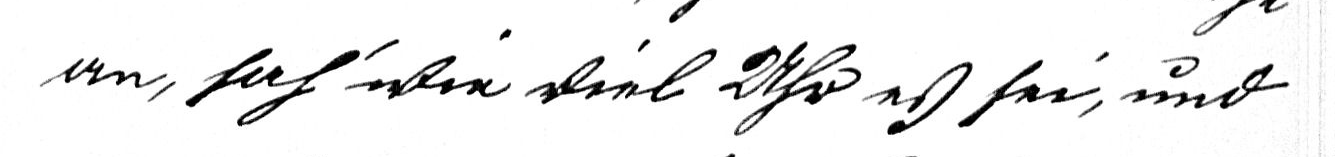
an, sach'wie viel Uhr es sei, und
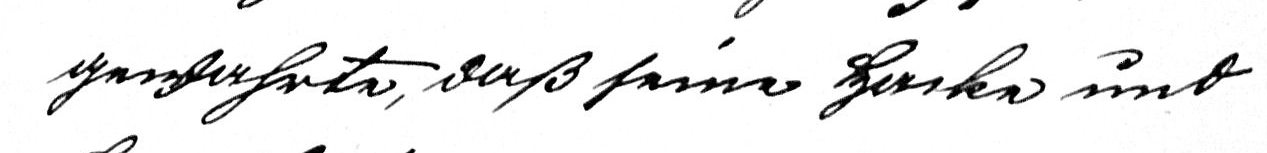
gewahrte, daß seine Harke und
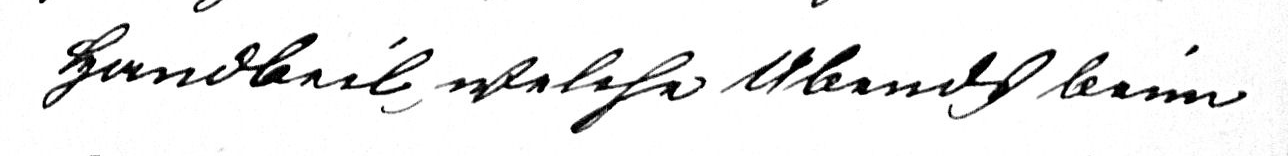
Handbeil welche Abends beim
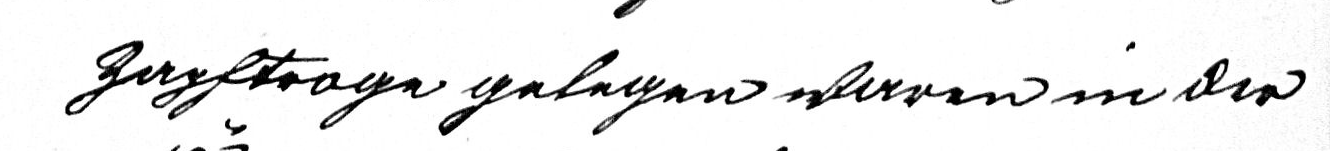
Zapftroge gelegen waren in der
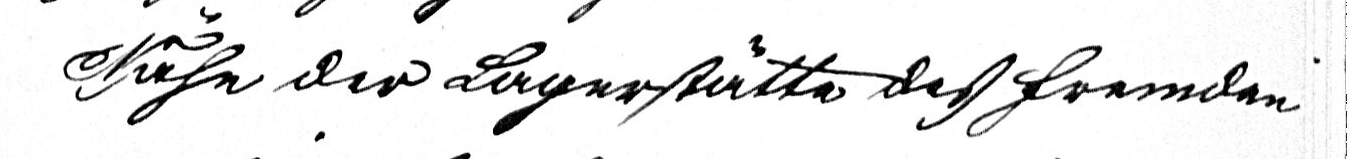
Nähe der Lagerstätte des Fremden
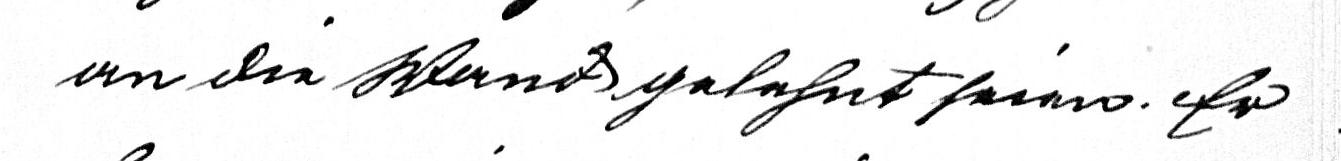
an die Wand gelehnt seien. Er
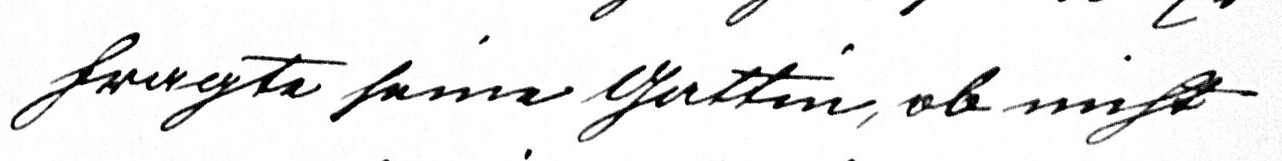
fragte seine Gattin, ob nicht
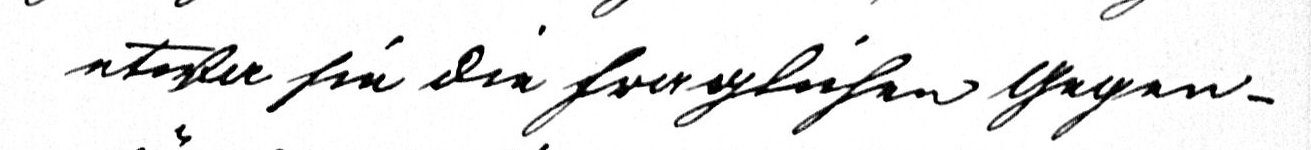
etwa sie die fraglichen Gegen¬
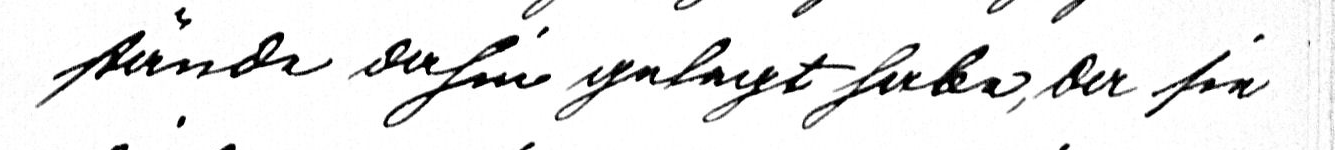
stände dahin gelegt habe, da sie
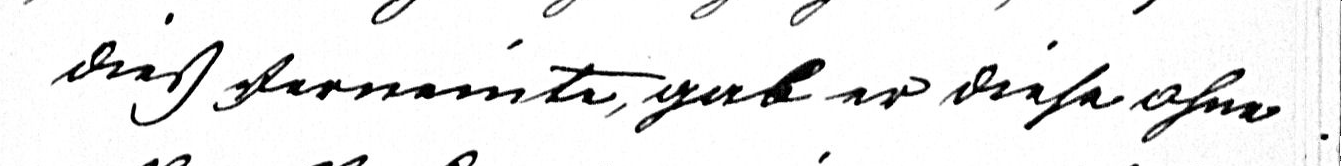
dies verneinte, gab er diese ohne
